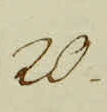20
